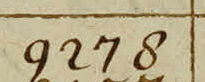9278
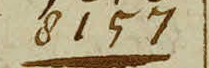8157
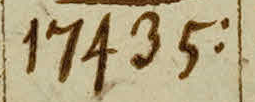17435:
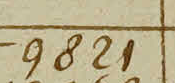9821
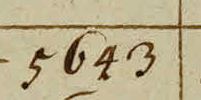5643
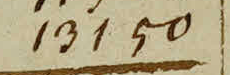13150
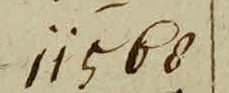11568
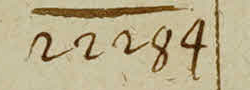22284
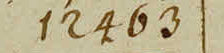12463
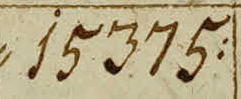15375
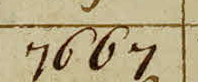7667
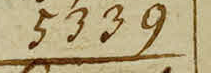5339
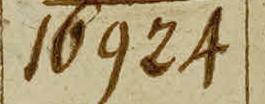16924
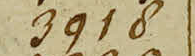3918
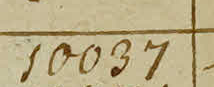10037
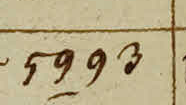5993
